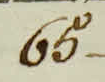65
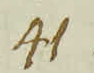41
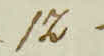12
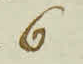6
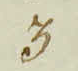3
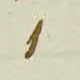1
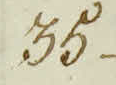35
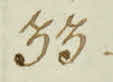33
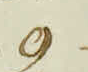9
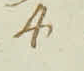4
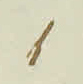1
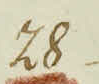28
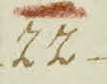22
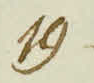19
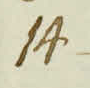14
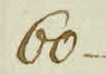60
